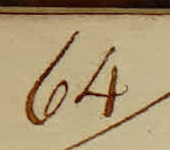64
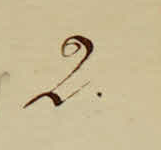2.
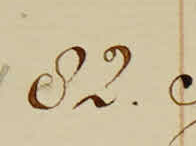82.
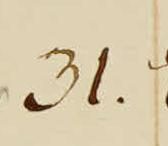31.
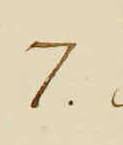7.
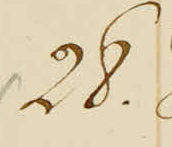28.
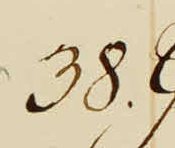38.
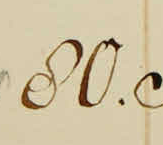80.
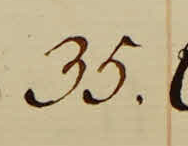35.
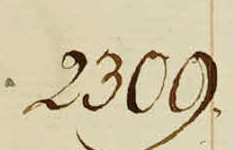2309
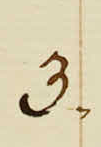3
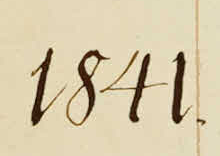1841
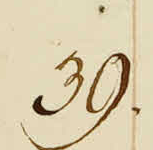39.
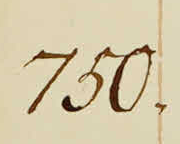750
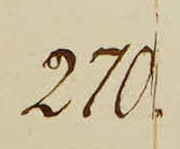270
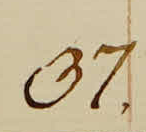37
